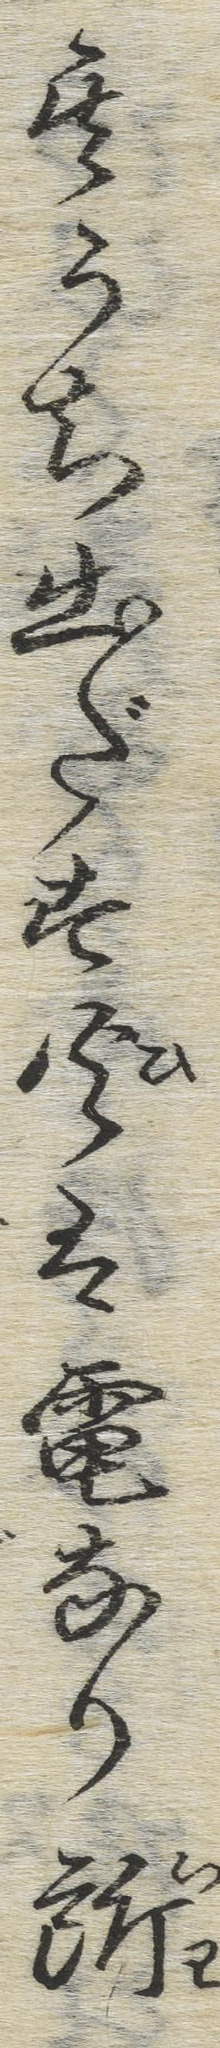其うち出だす火は電なり所
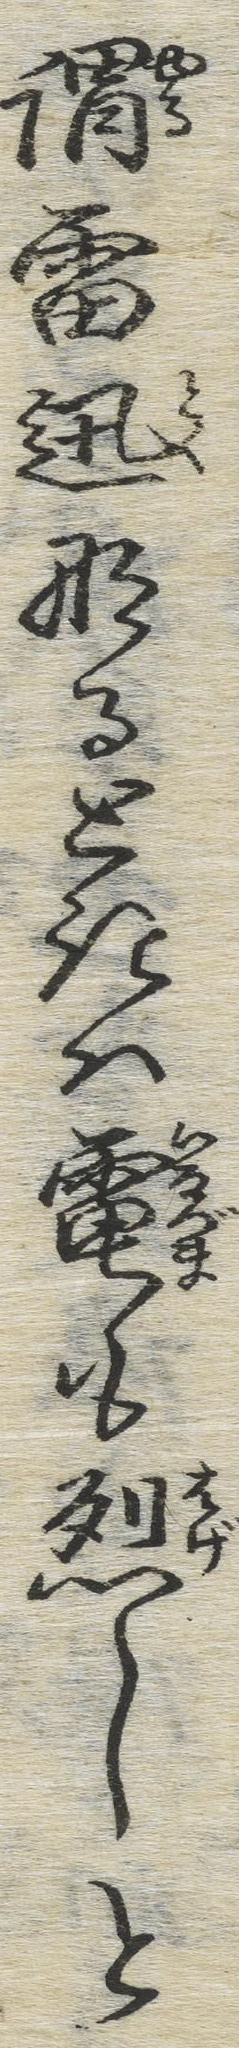謂雷迅なるときは電も烈しと
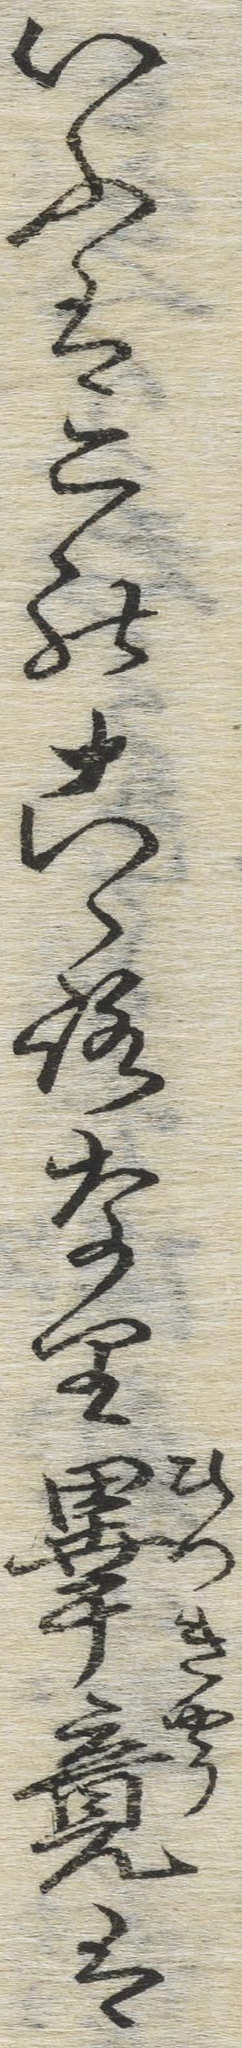いふはこのこゝろなり畢竟は
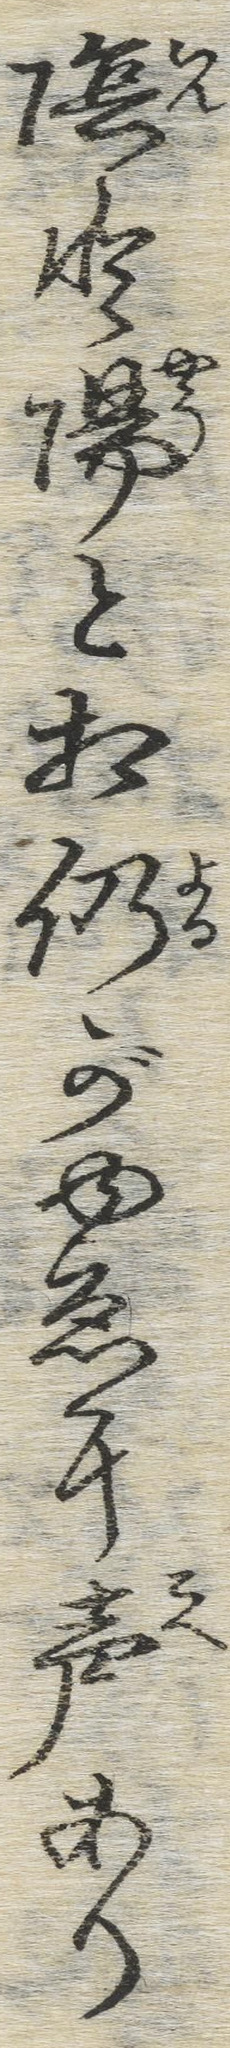陰と陽と相仍がゆゑに声あり
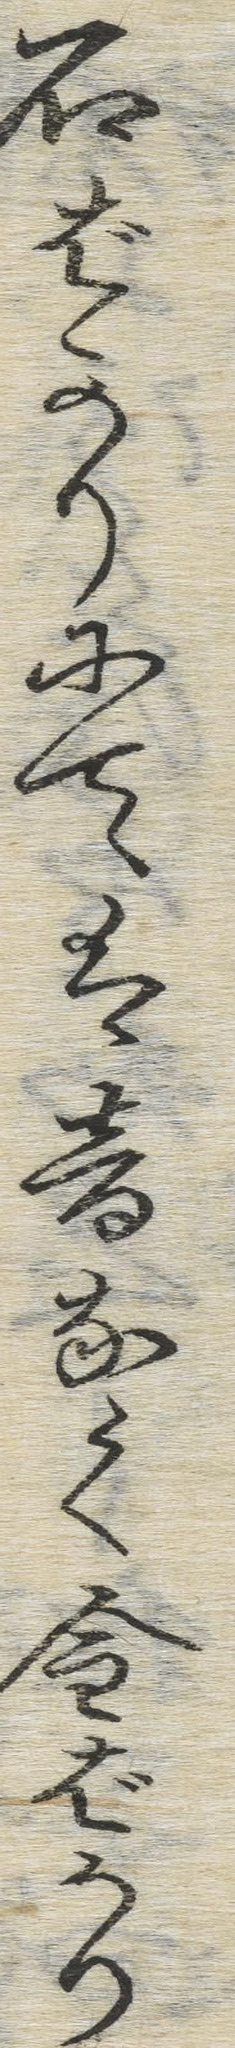石ばかりにては音なく金ばかり
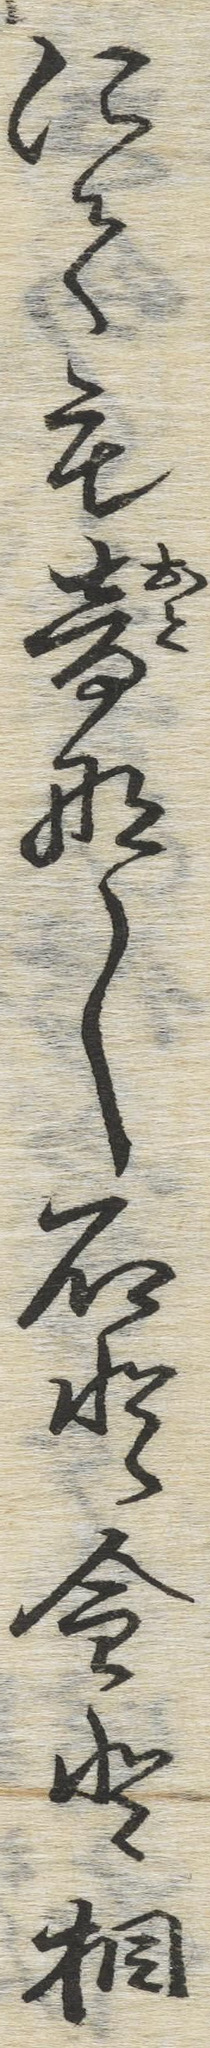にても音なし石と金と相
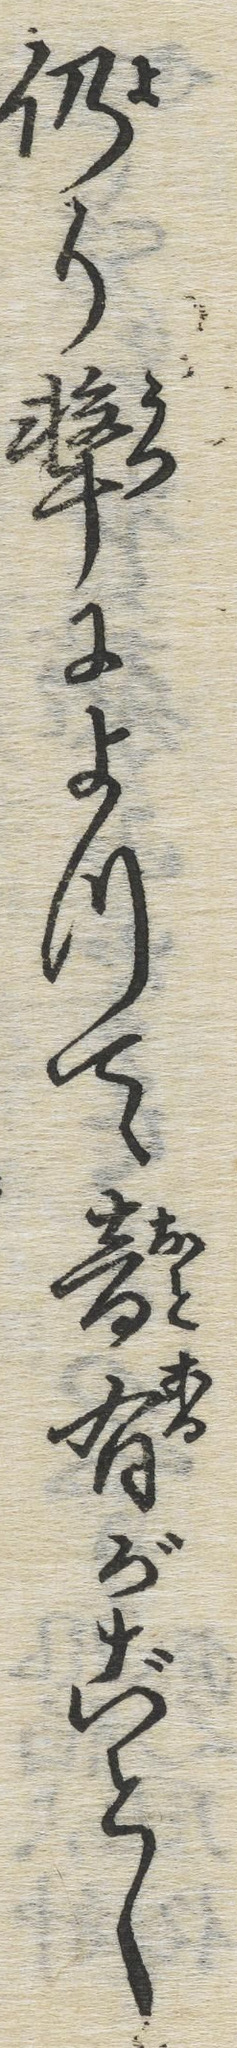仍り撃によつて音有がごとし
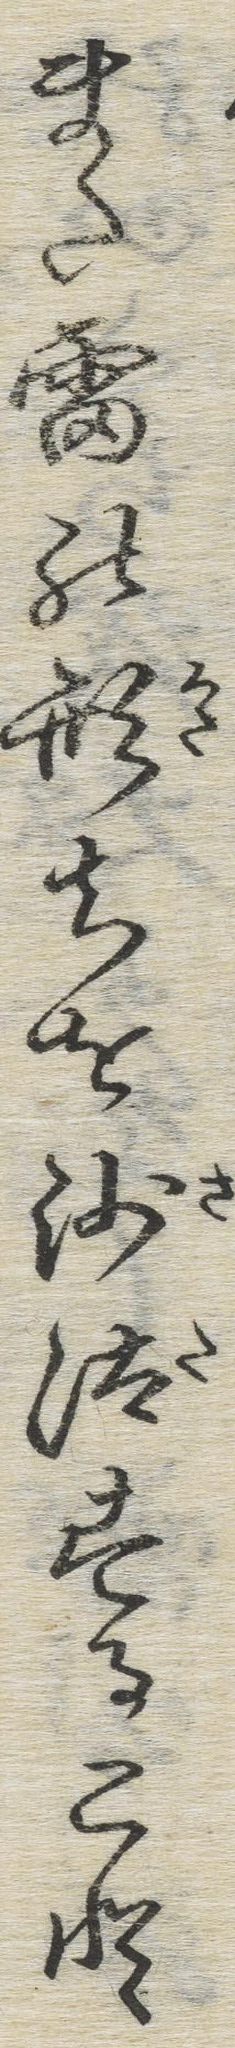また雷の形ちを沙汰すること
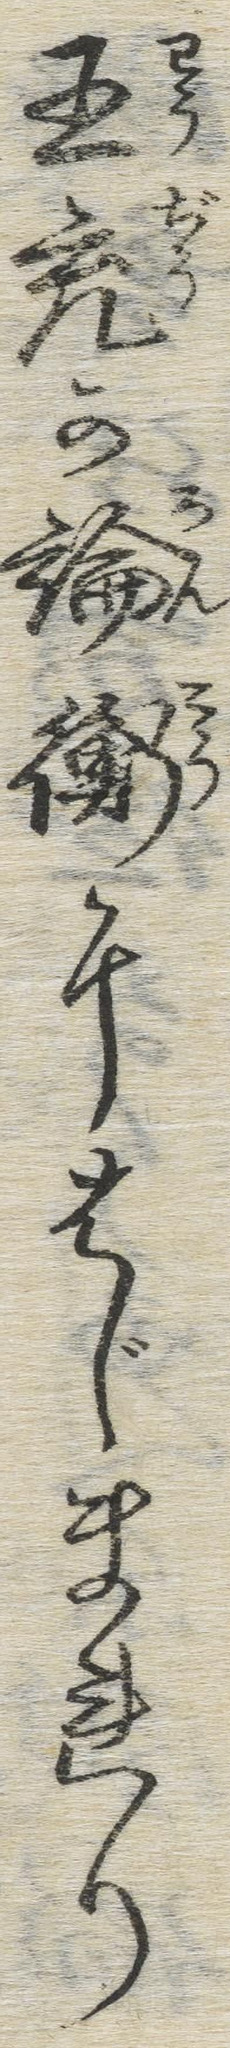王充か論衡にはじまれり
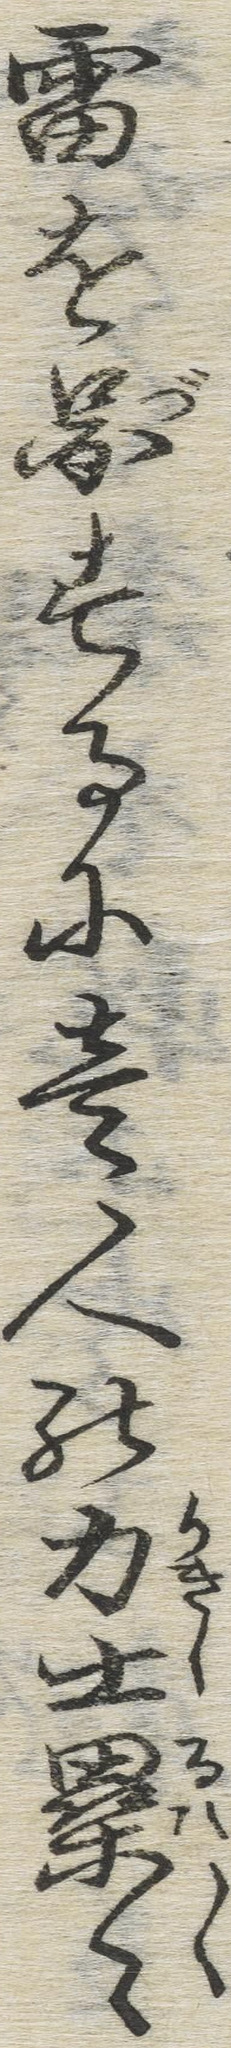雷を図するに壱人の力士累々
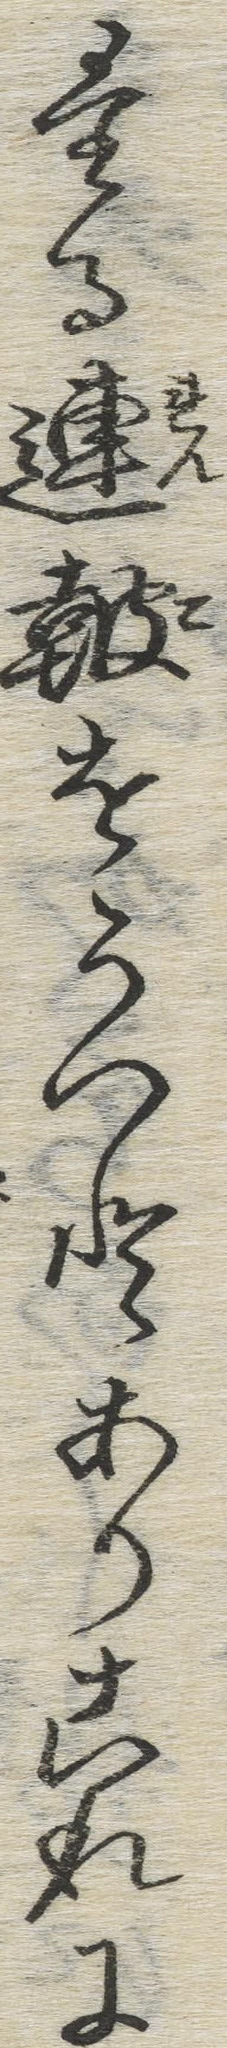たる連皷をうつとありこれに
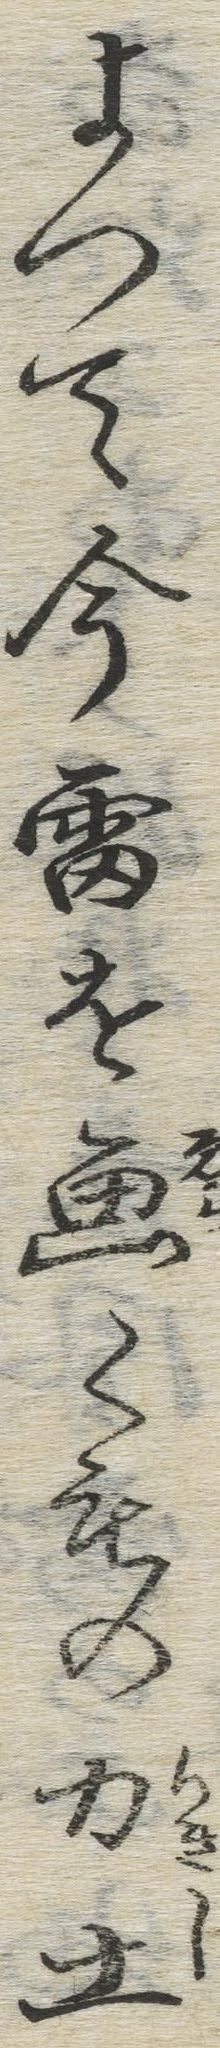よつて今雷を画くもの力士
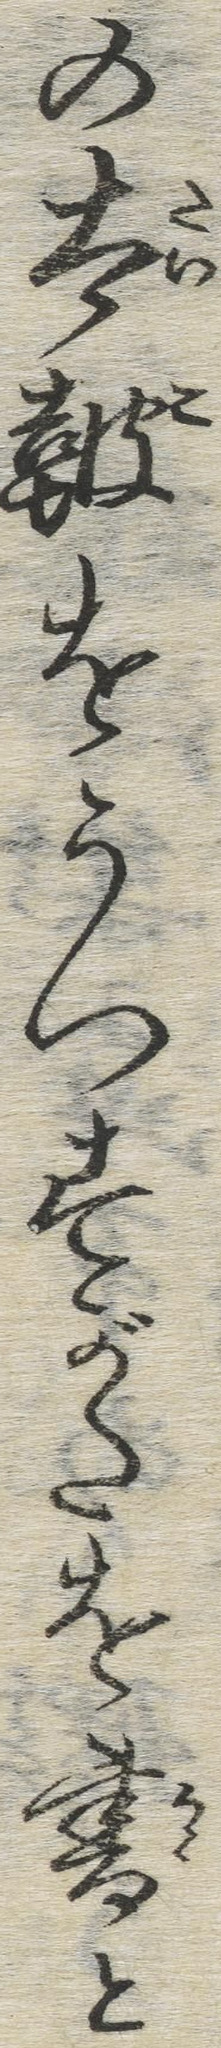の太鼓をうつすがたを書と
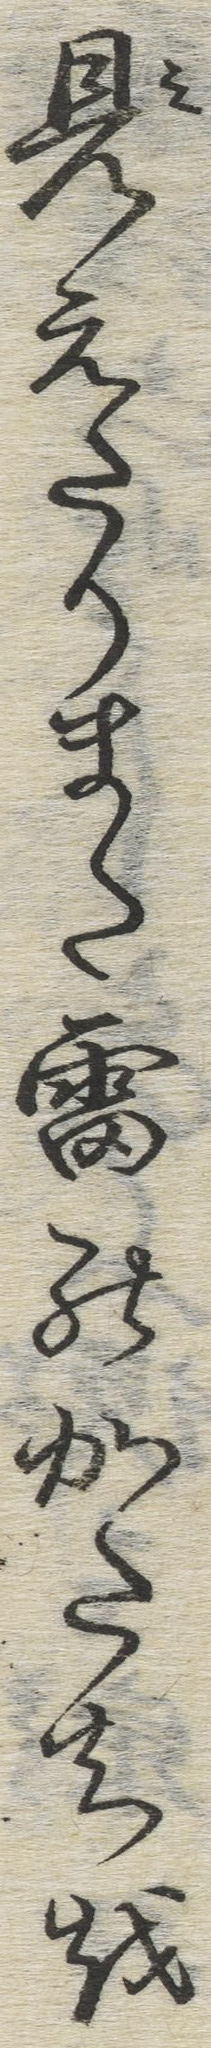見えたりまた雷のかたちを

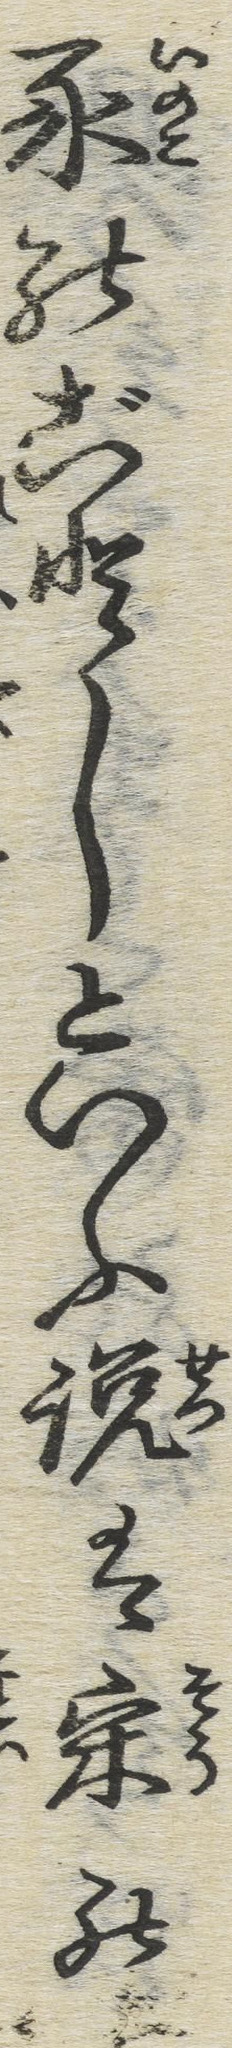豕のごとしといふ説は宋の
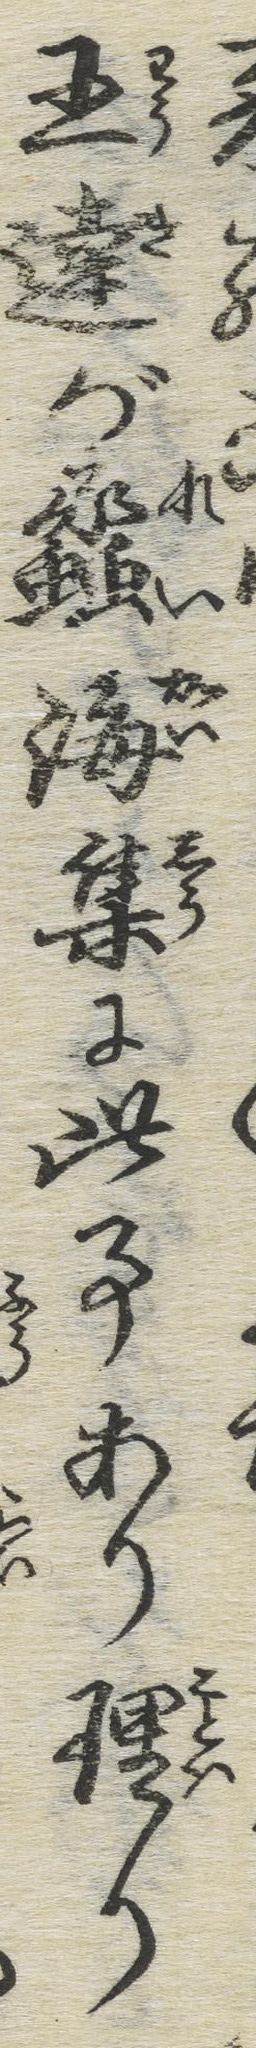王逵が蠡海集に此事あり理り
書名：雷公地震由來記　全
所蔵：東京大学地震研究所図書室 Earthquake Research Institute Library, The University of Tokyo, JAPAN
